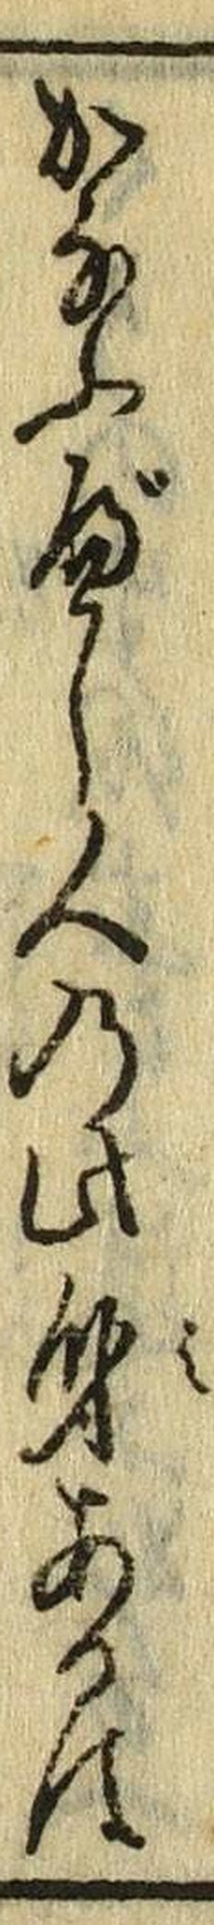かなふべし人の此身あるは
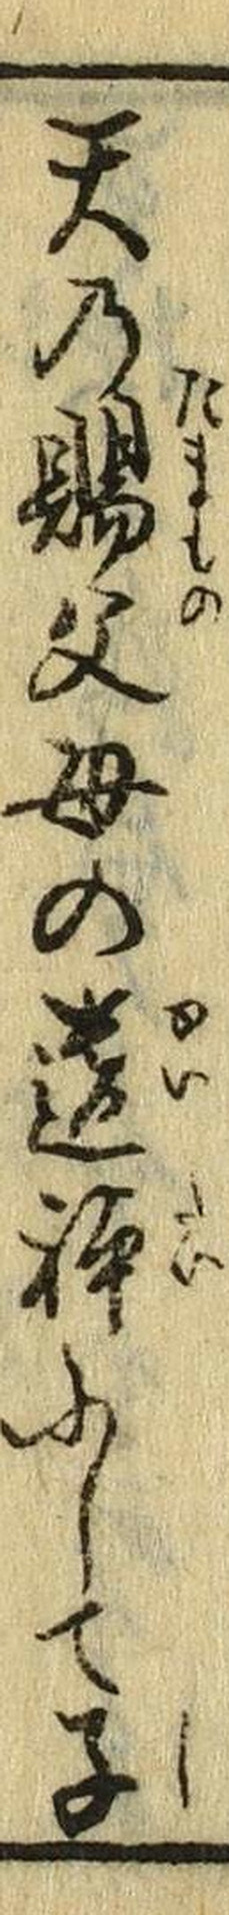天の賜父母の遺体にして子
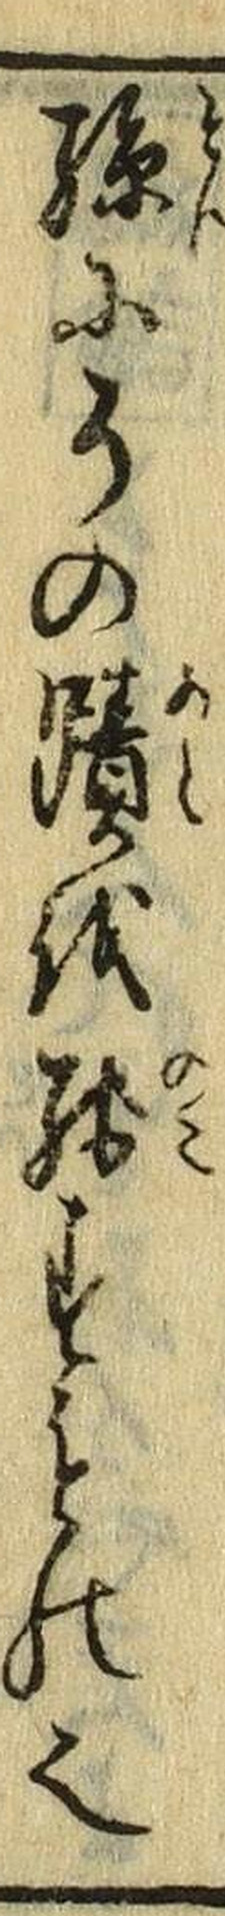孫にその蹟を残すもの也
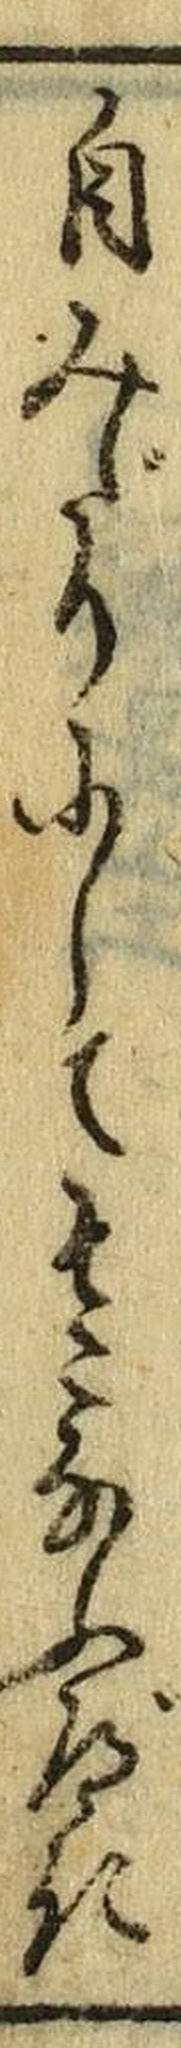自みだりにしてそこなふべき
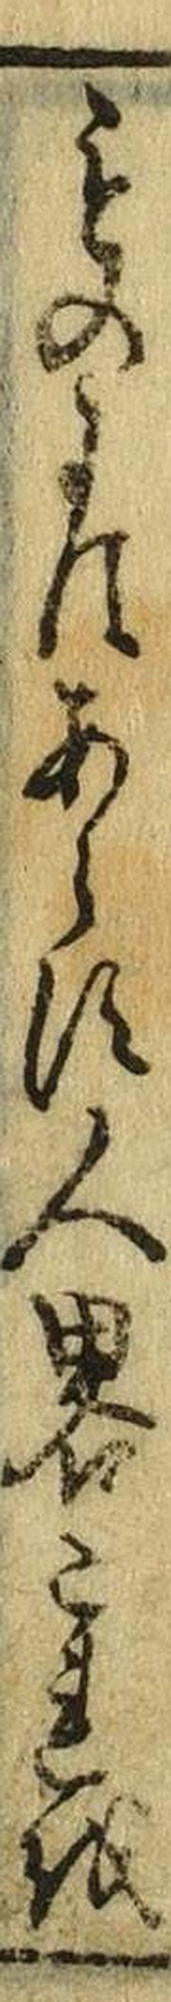ものにはあらす人畧これを
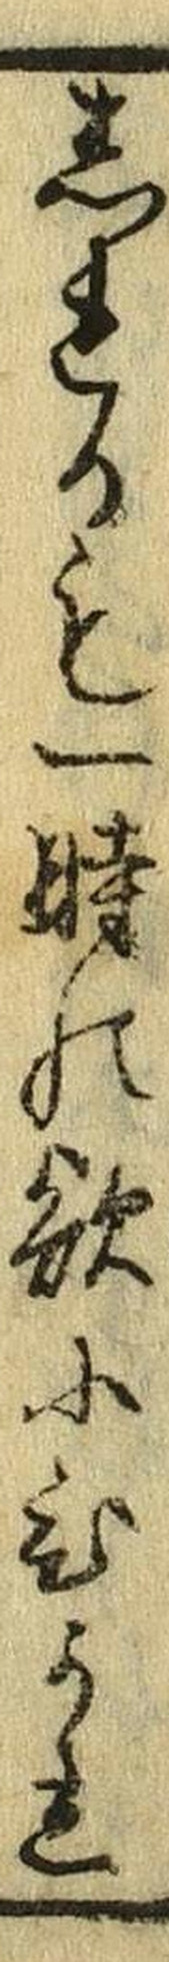しれるも一時の欲にひかれ
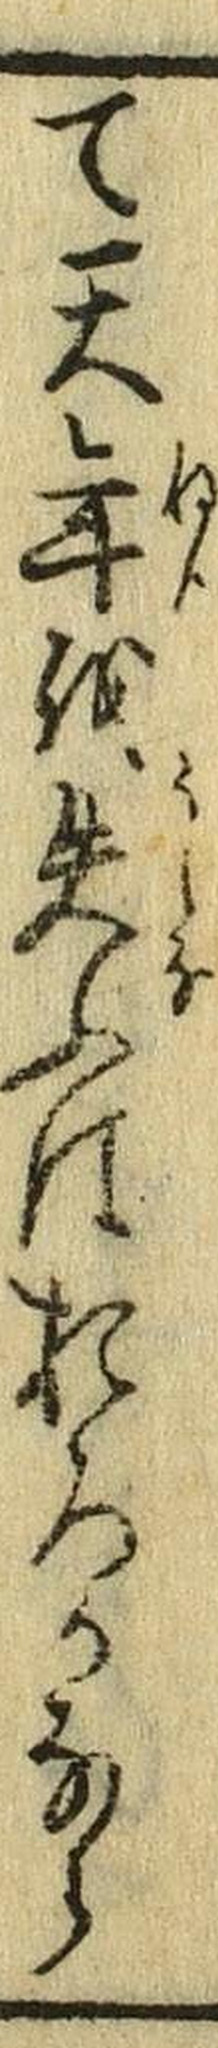て天年を失ふはおろかなら
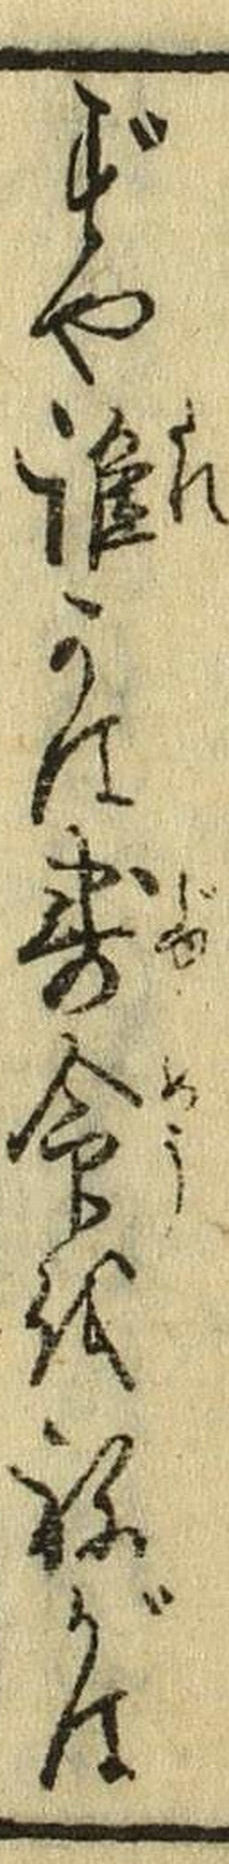ずや誰かは寿命をねがは
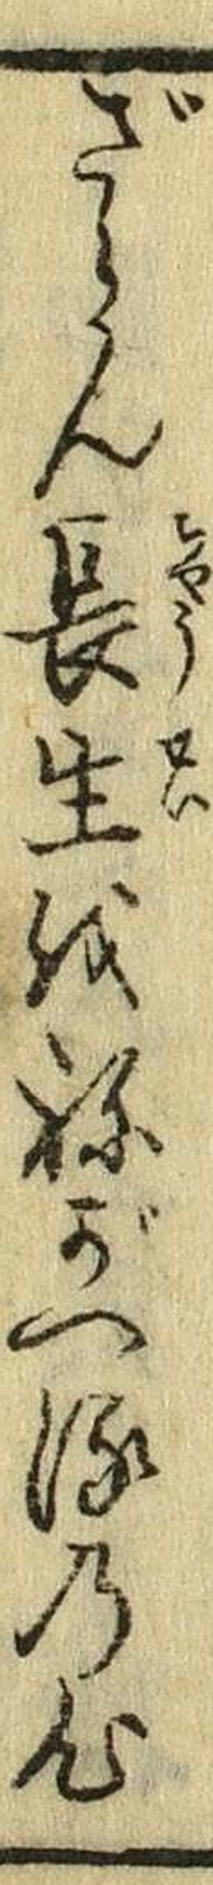ざらん長生をねがへるの心
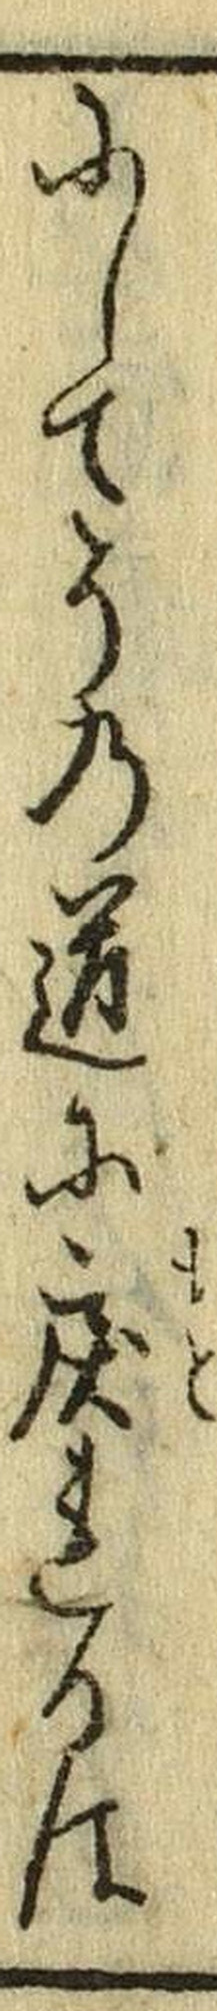にしてその道に戻れるは
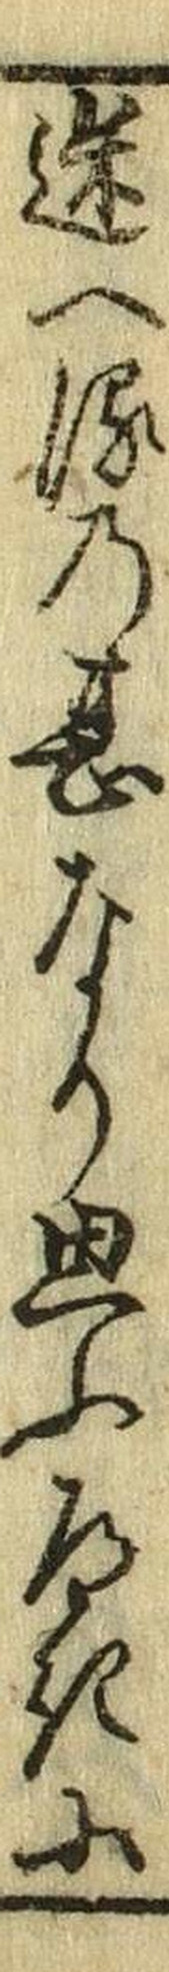迷へるの甚なり思ふへきに
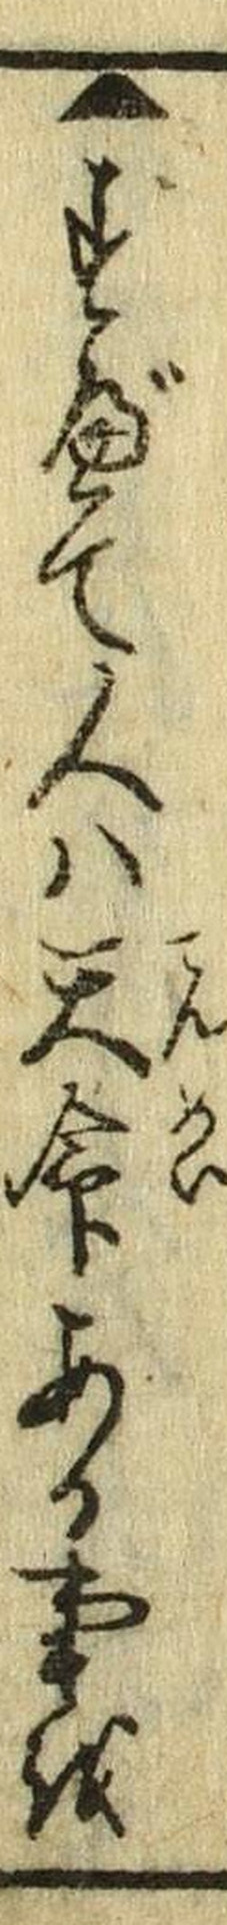▲すべて人は天命ある事を
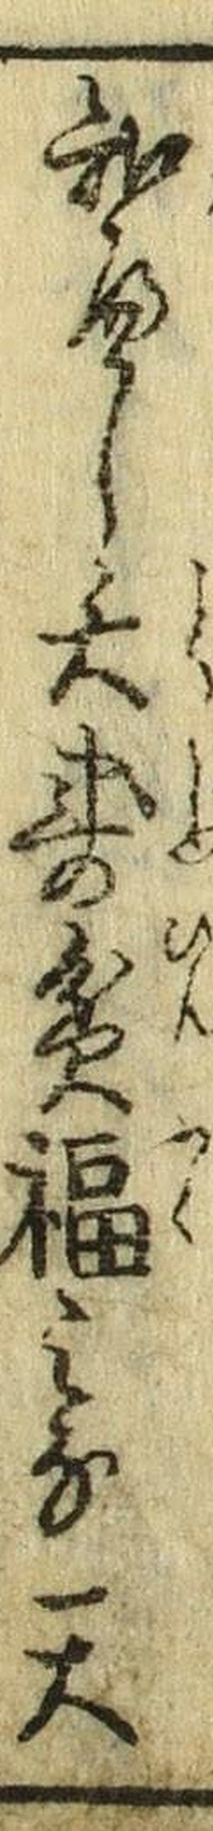知へし夭寿貧福みな天
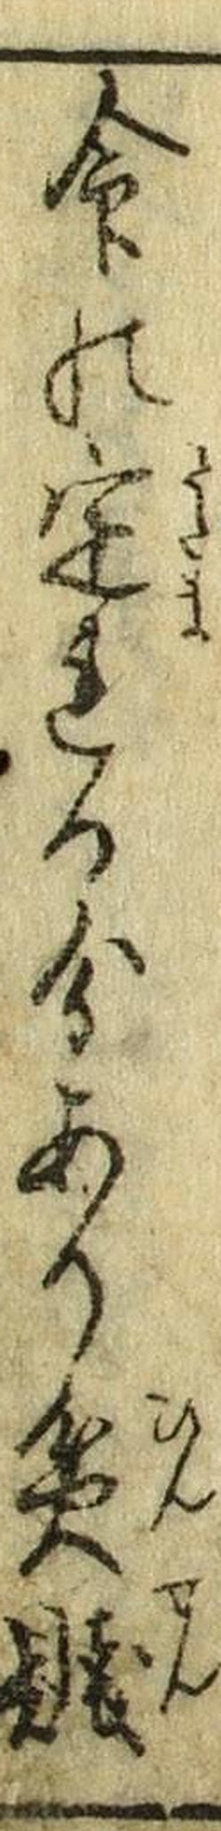命の定れる分あり貧賤
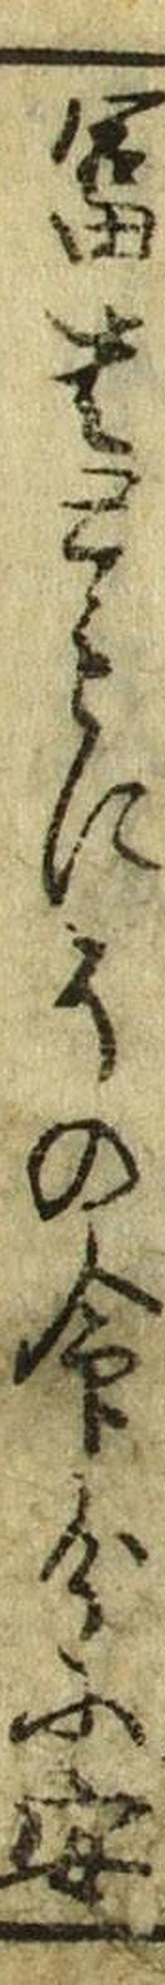富貴ともにその命分に安

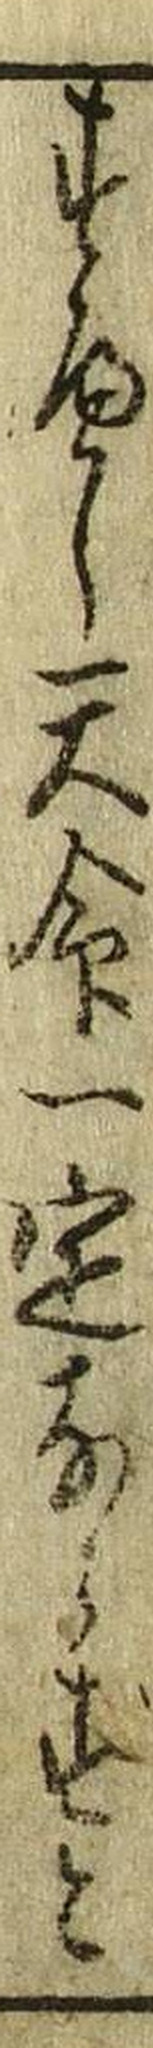ずへし天命一定ならずと
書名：居家養生記
